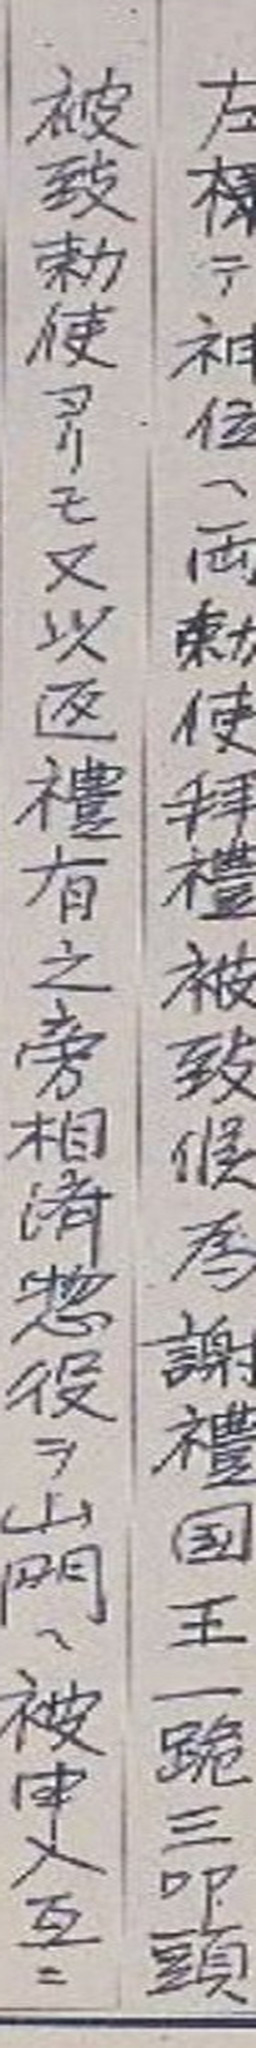被致勅使よりも又以返礼有之旁相済惣役を山門へ被申入互に
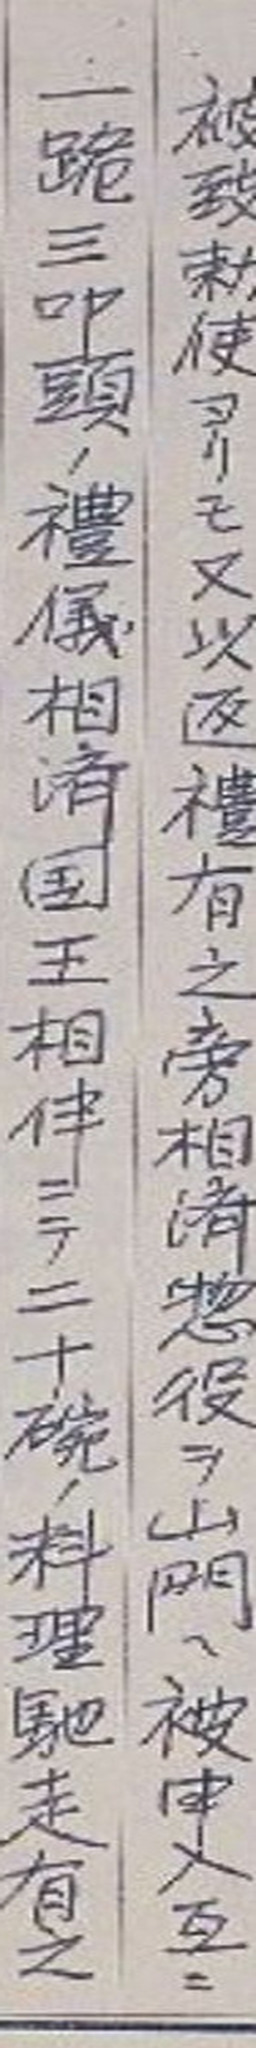一跪三叩頭の礼儀相済国王相伴にて二十碗の料理馳走有之
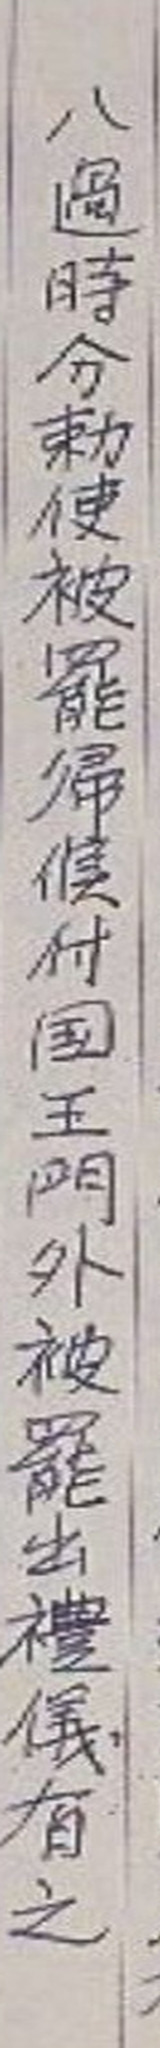八過時分勅使被罷帰候付国王門外被罷出礼儀有之
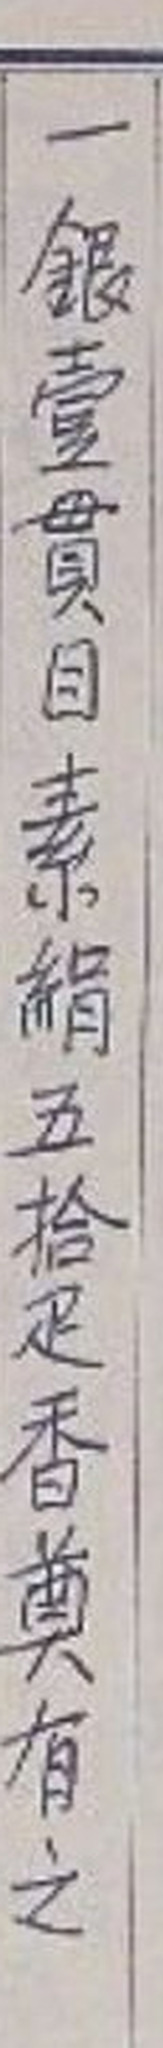一銀壱貫目素絹五拾疋香奠有之
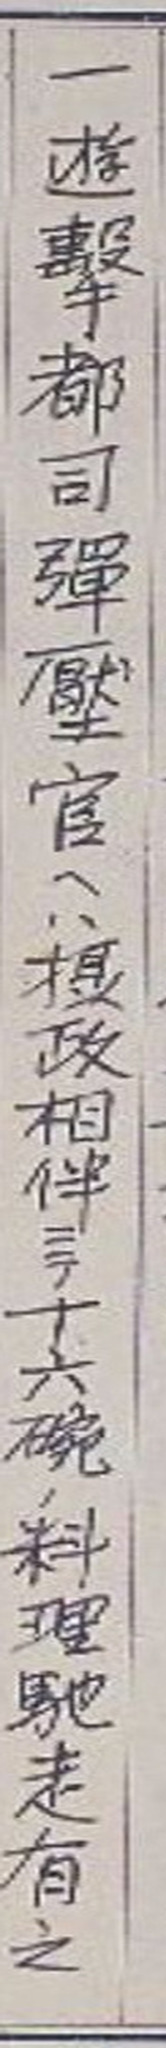一遊撃都司弾圧官へは摂政相伴にて十六碗の料理馳走有之
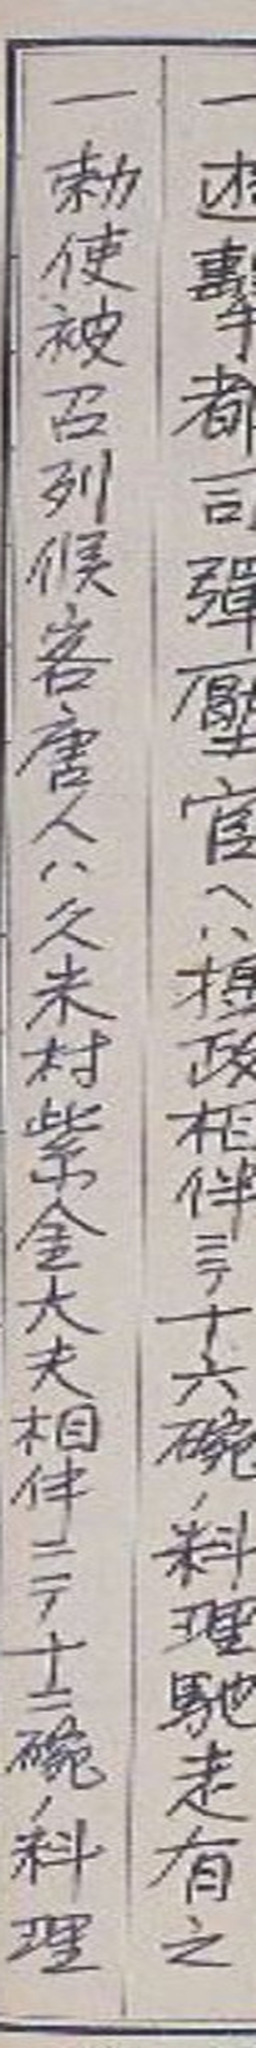一勅使被召列候客唐人は久米村紫金大夫相伴にて十二碗の料理
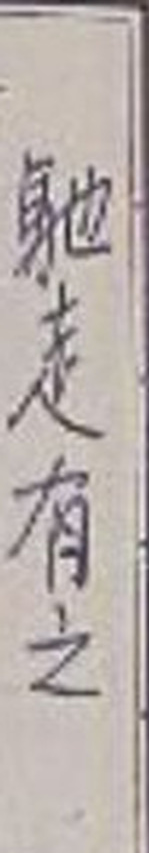馳走有之
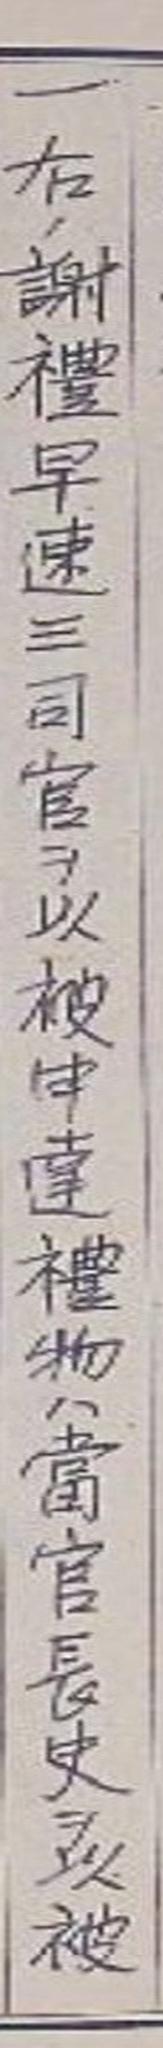一右の謝礼早速三司官を以被申達礼物は当官長史を以被
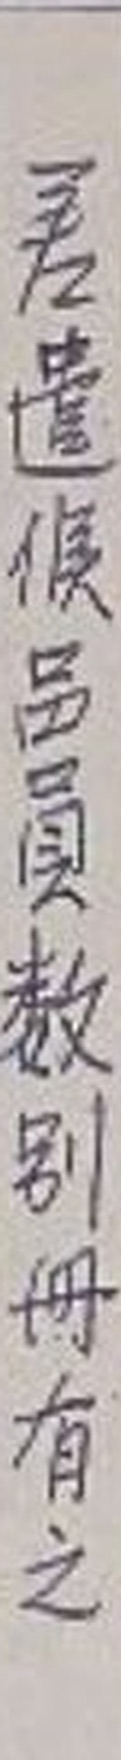差遣候品員数別冊有之
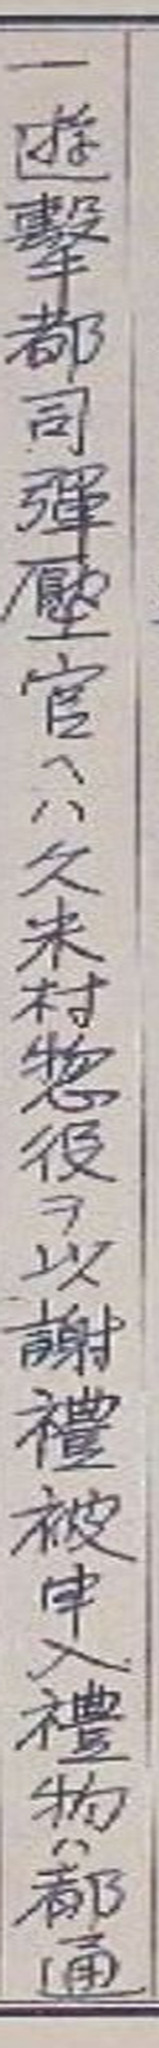一遊撃都司弾圧官へは久米村惣役を以謝礼被申入礼物は都通
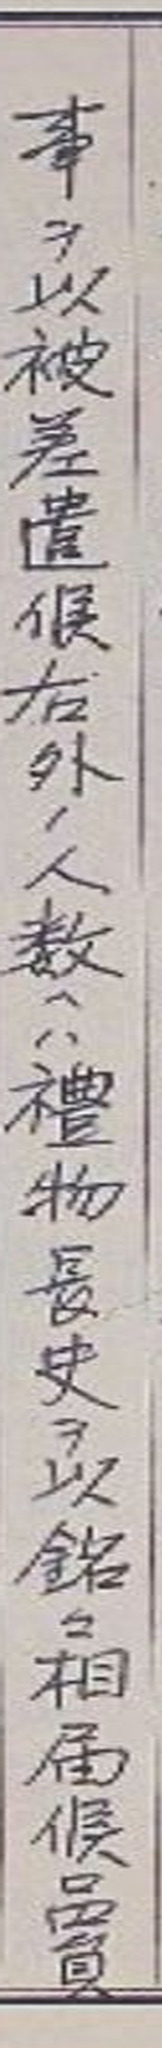事を以被差遣候右外の人数へは礼物長史を以銘々相届候品員
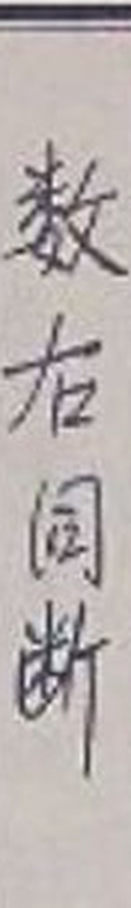数右同断
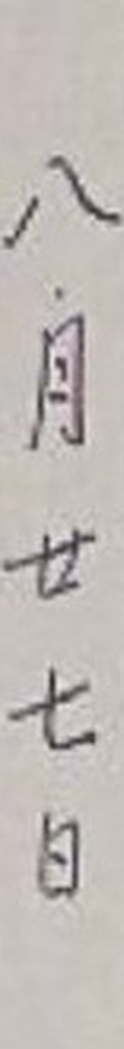八月廿七日
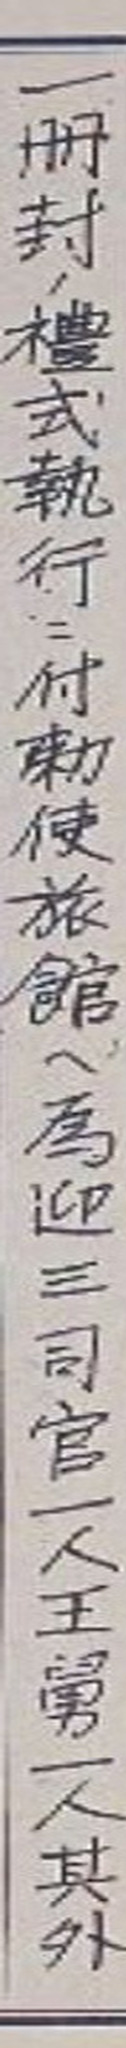一冊封の礼式執行に付勅使旅館へ為迎三司官一人王舅一人其外
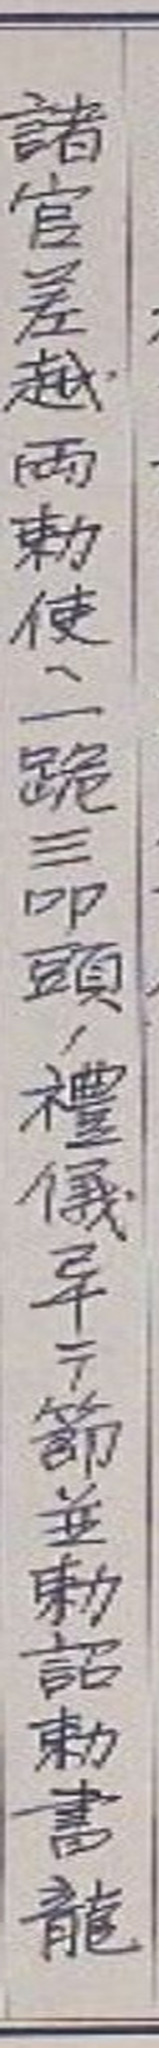諸官差越両勅使へ一跪三叩頭の礼儀畢て節並勅詔勅書龍
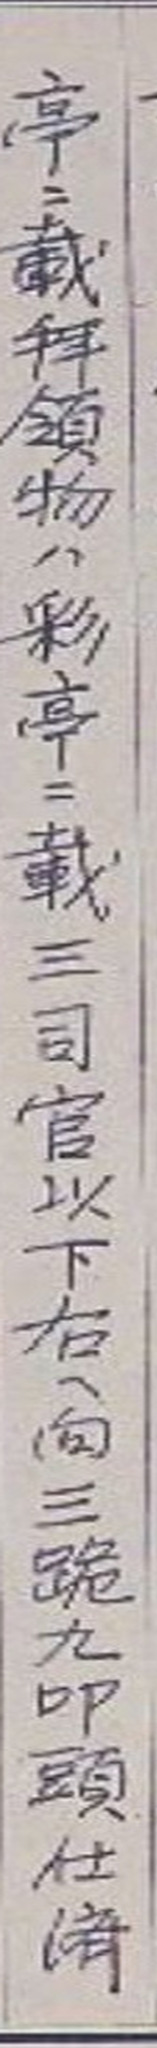亭に載拝領物は彩亭に載三司官以下右へ向三跪九叩頭仕済
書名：支那冊封使来琉諸記 下巻
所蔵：University of the Ryukyus Library
